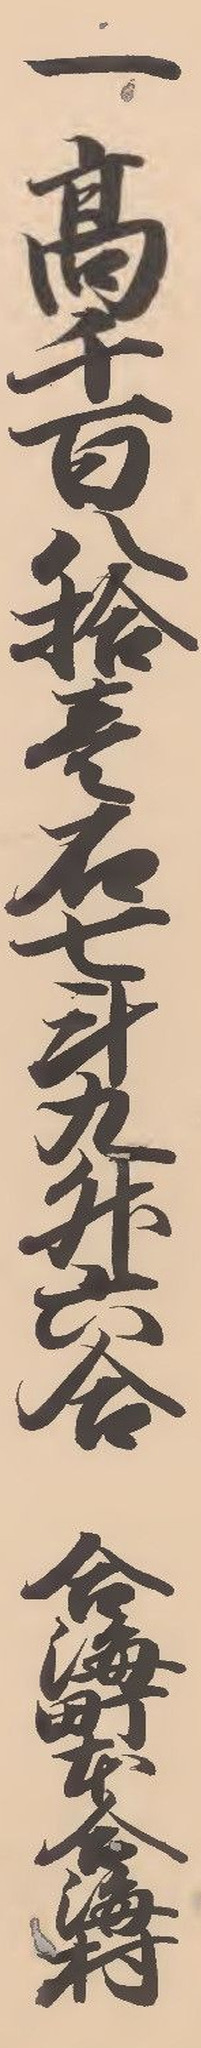一高千百八拾壱石七斗九升六合合海町本合海村
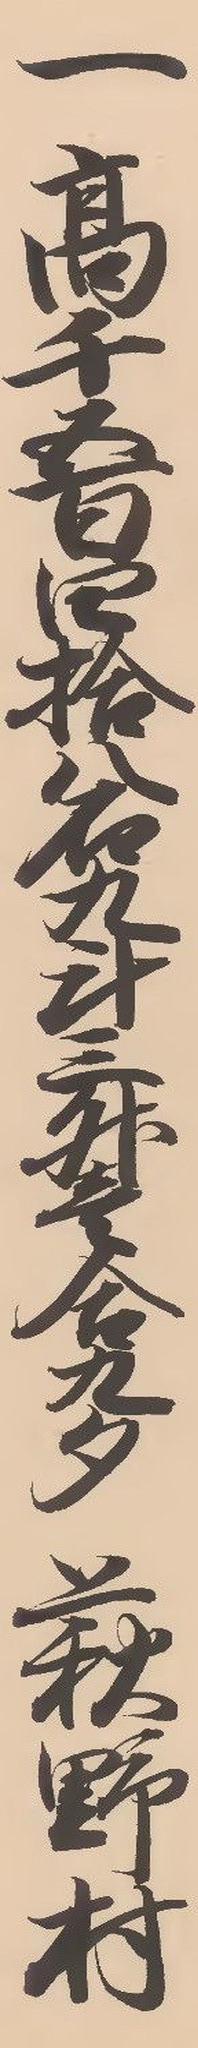一高千五百四拾八石九斗三升壱合九勺萩野村
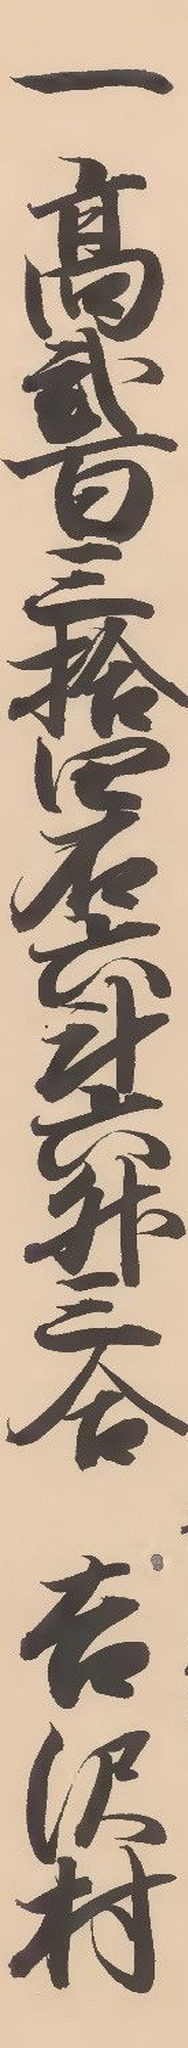一高弐百三拾四石六斗六升三合吉沢村
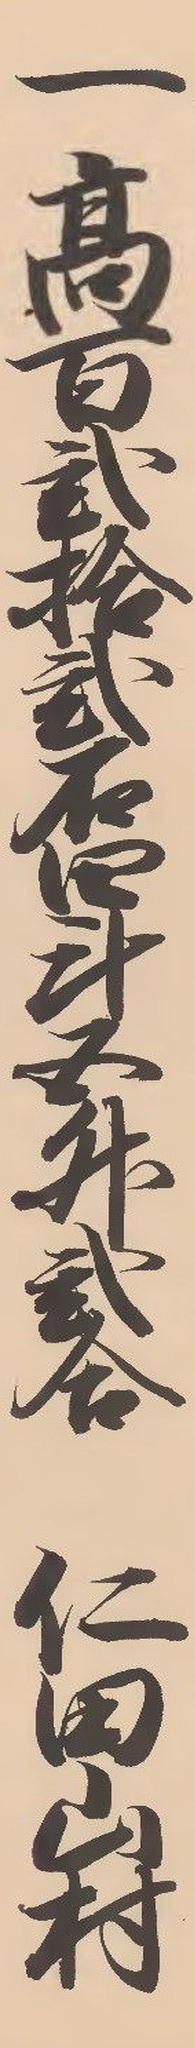一高百弐拾弐石四斗五升弐合仁田山村
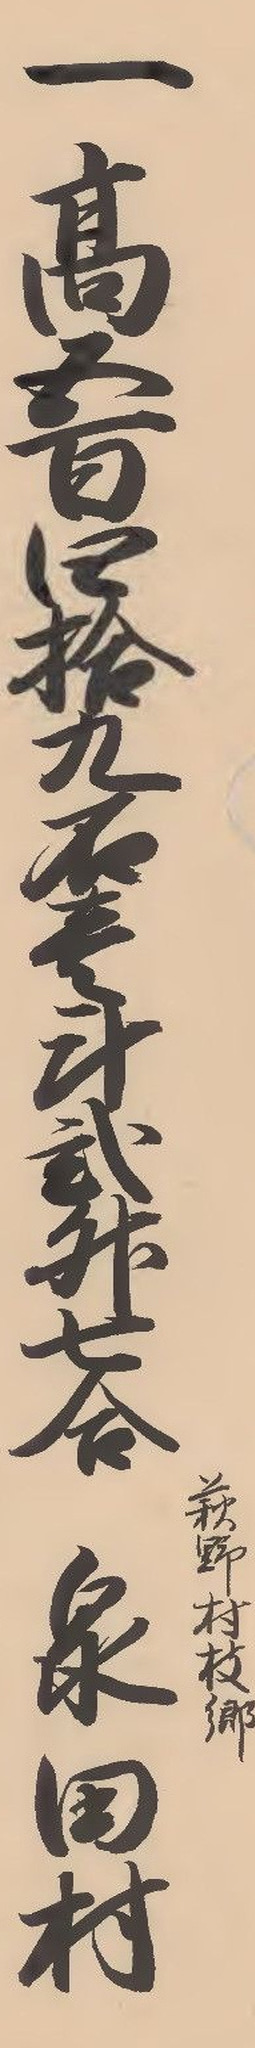一高五百四拾九石壱斗弐升七合泉田村
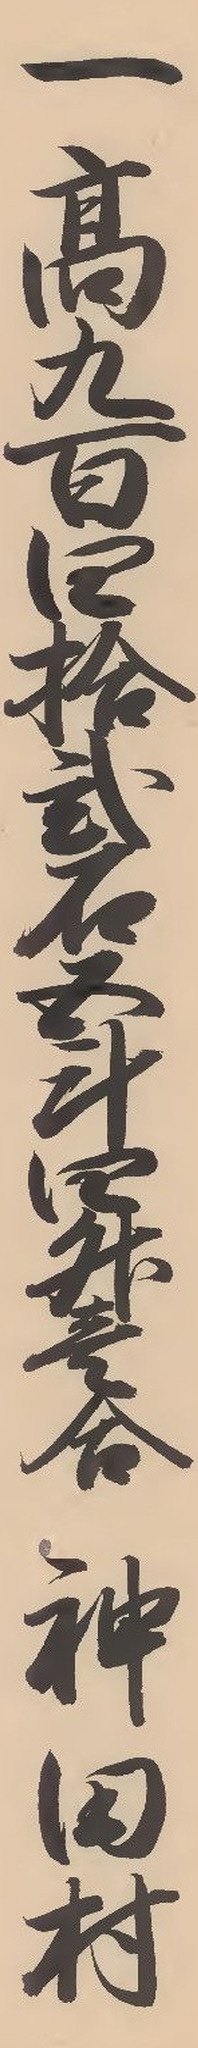一高九百四拾弐石五斗四升壱合神田村
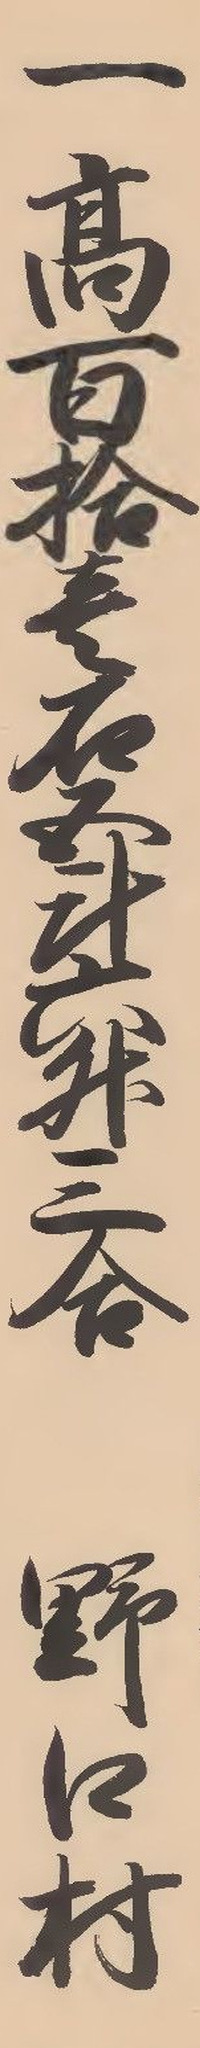一高百拾壱石五斗六升三合野口村
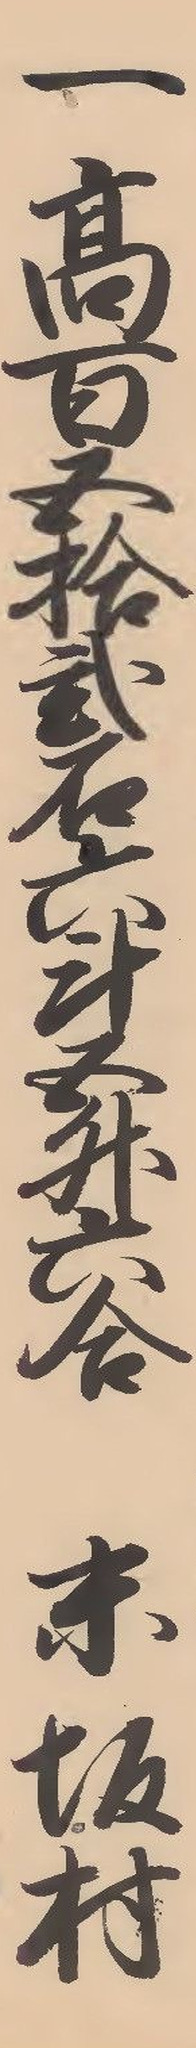一高百五拾弐石六斗五升六合末坂村

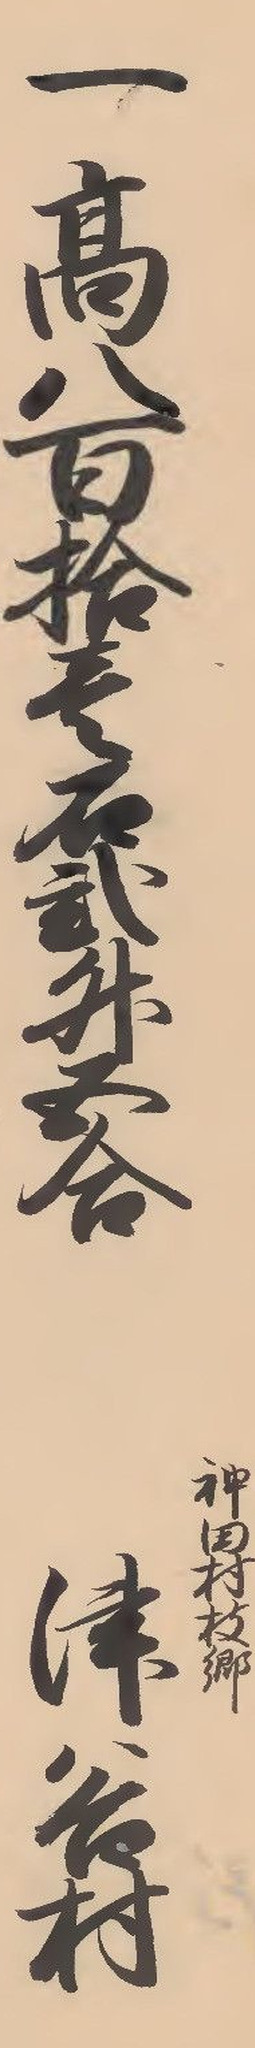一高八百拾壱石弐升五合津谷村
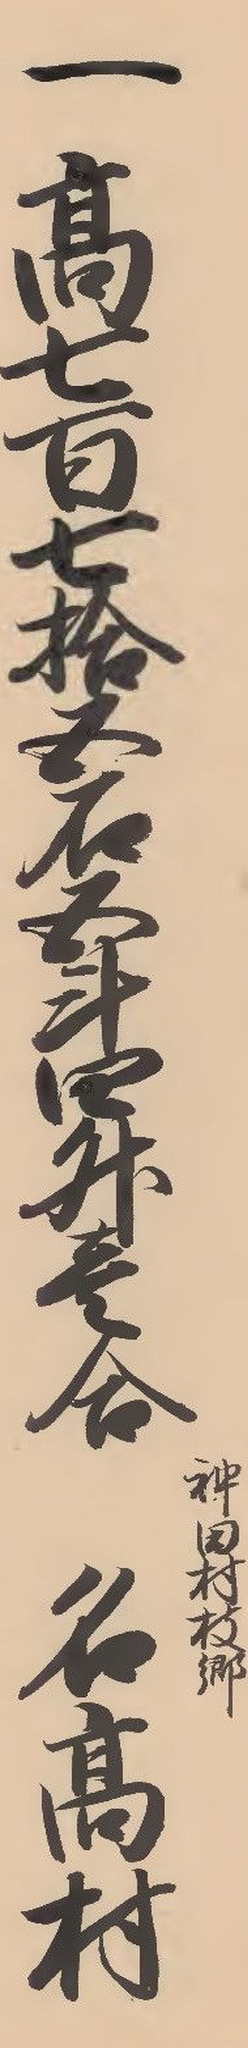一高七百七拾五石五斗四升壱合名高村
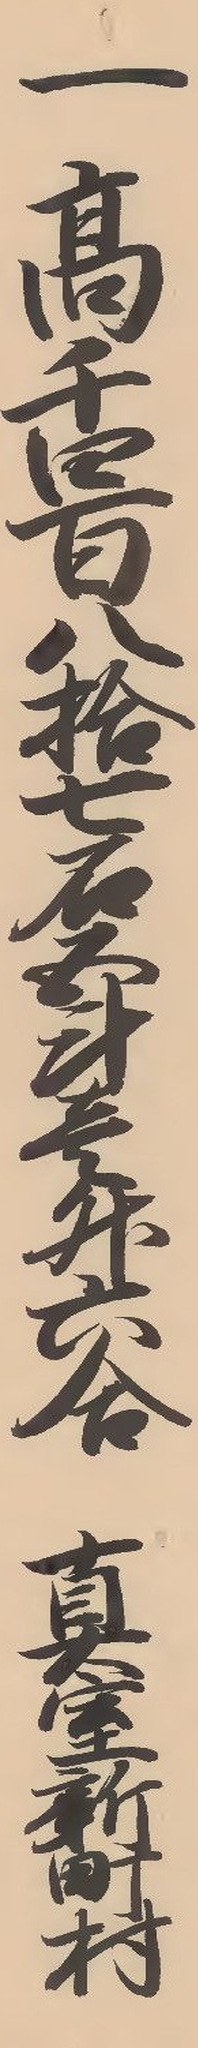一高千四百八拾七石五斗壱升六合真室新町村
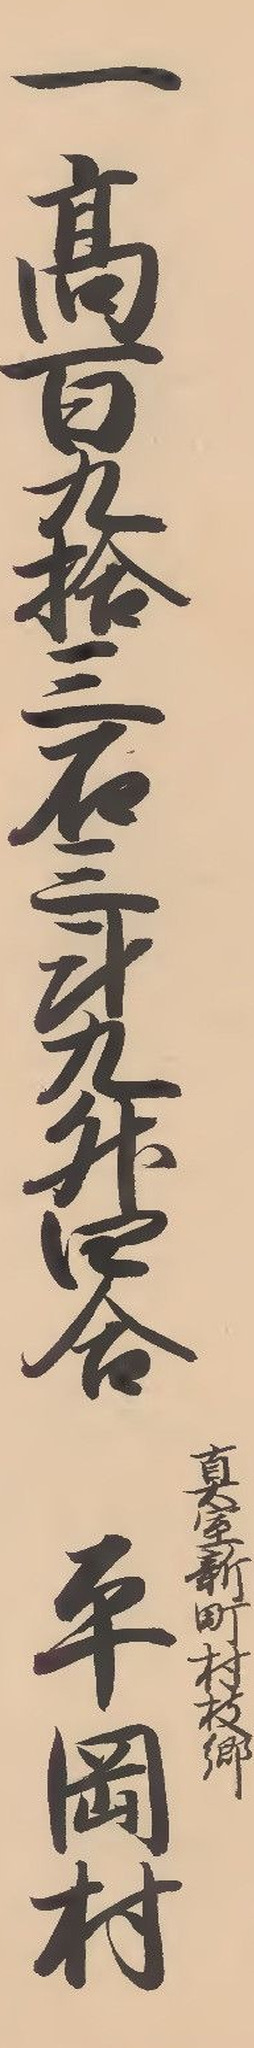一高百九拾三石三斗九升四合平岡村
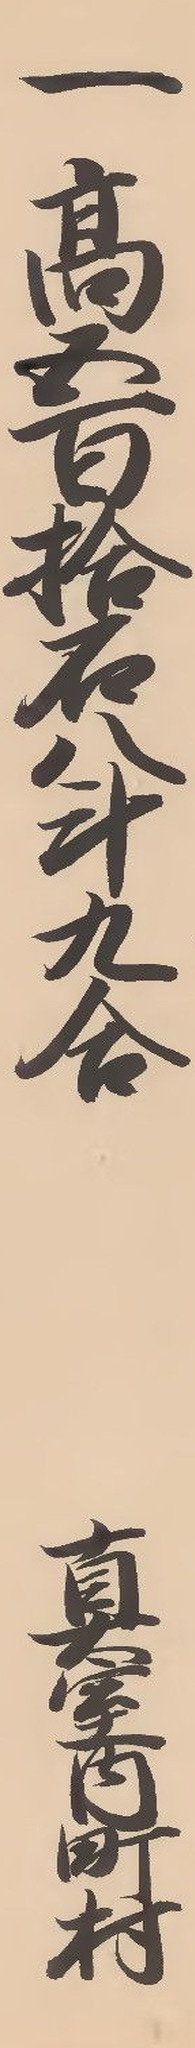一高五百拾石八斗九合真室内町村
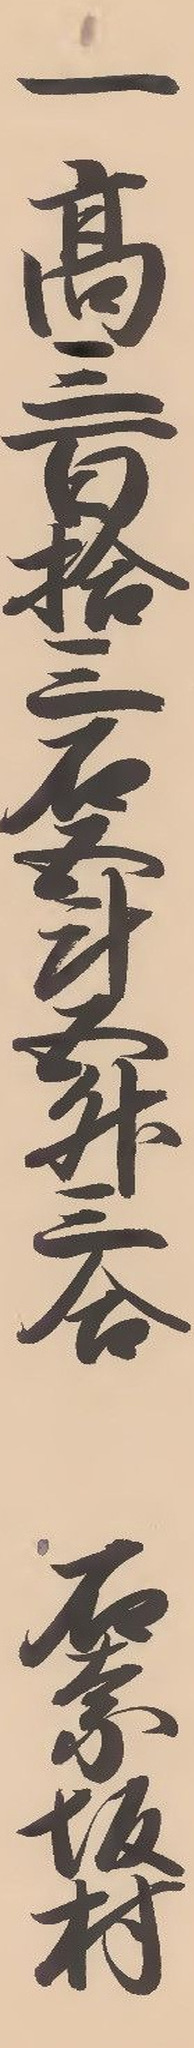一高三百拾三石五斗五升三合石奈坂村
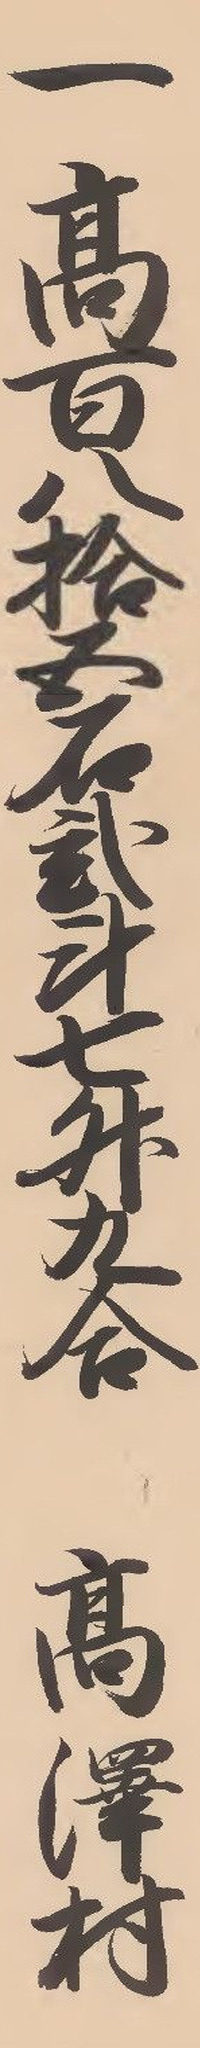一高百八拾五石弐斗七升九合高沢村
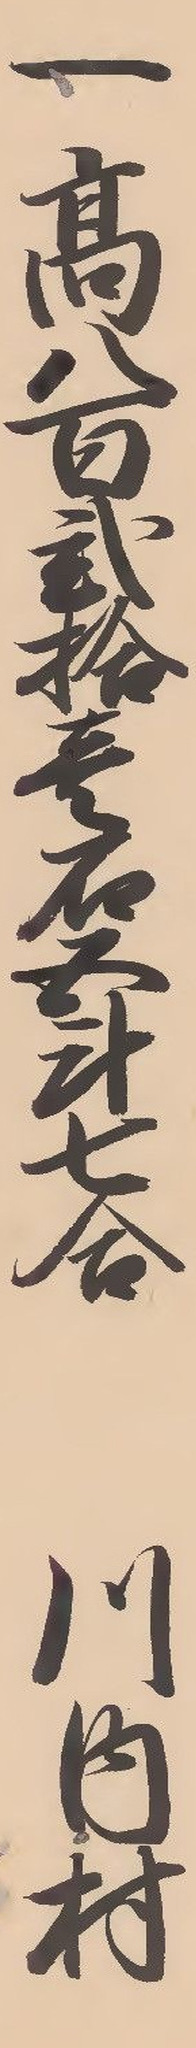一高八百弐拾壱石五斗七合川内村
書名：出羽国郷帳　３
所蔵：国立公文書館 National Archives of Japan
